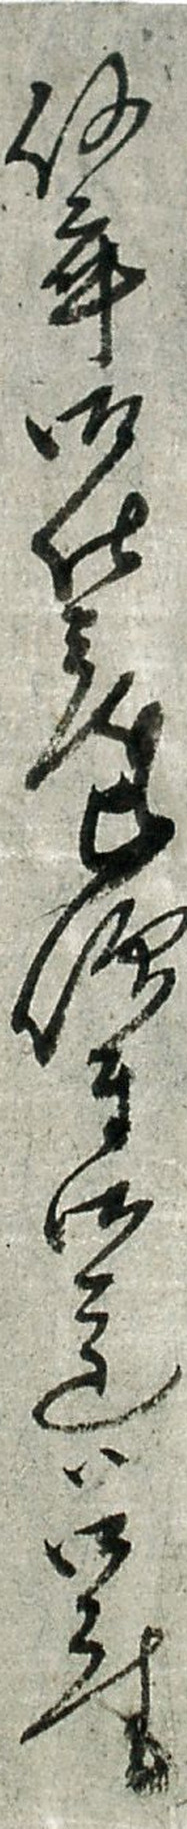何卒御仕度被仰付御道は御座
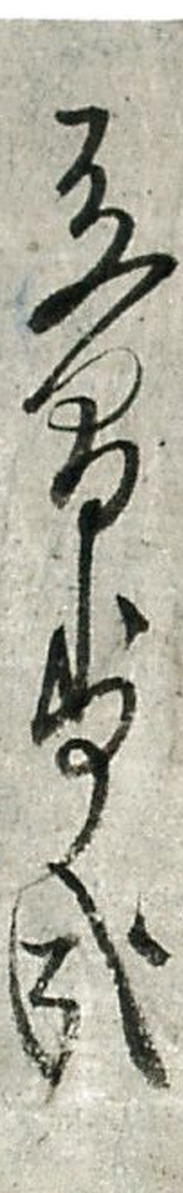有間布哉
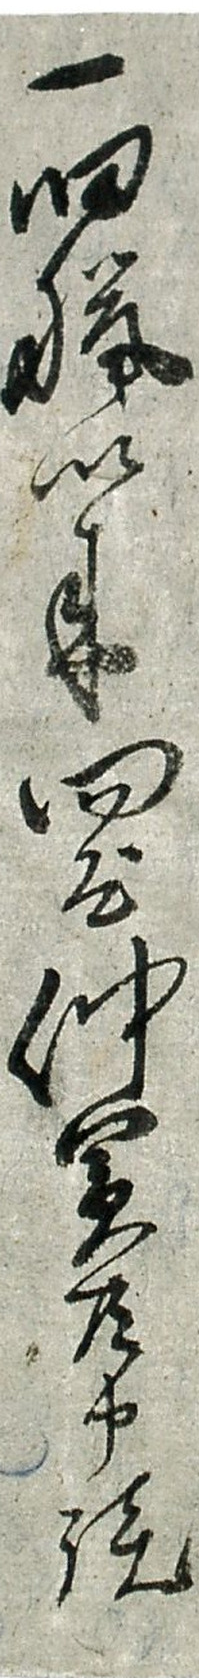一旧臘以来問屋仲買共申談
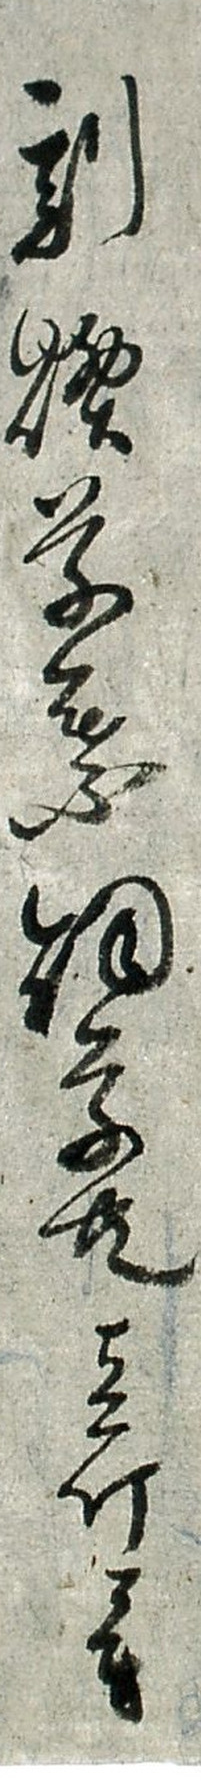刻煙草葉烟草共壱斤に付
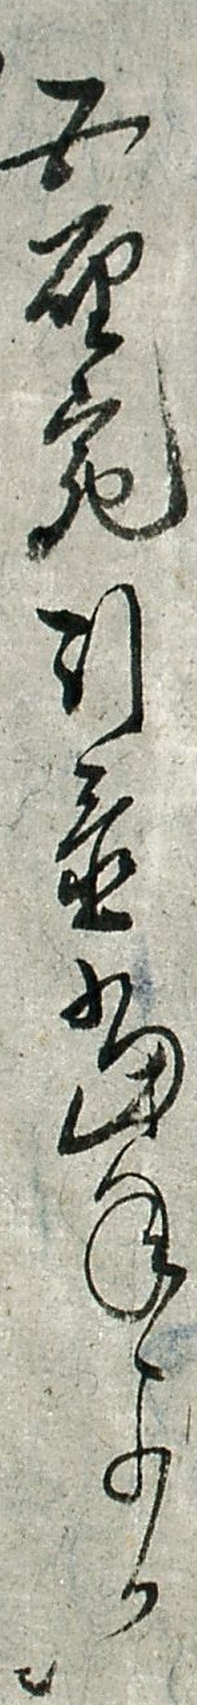五厘宛引置当年より
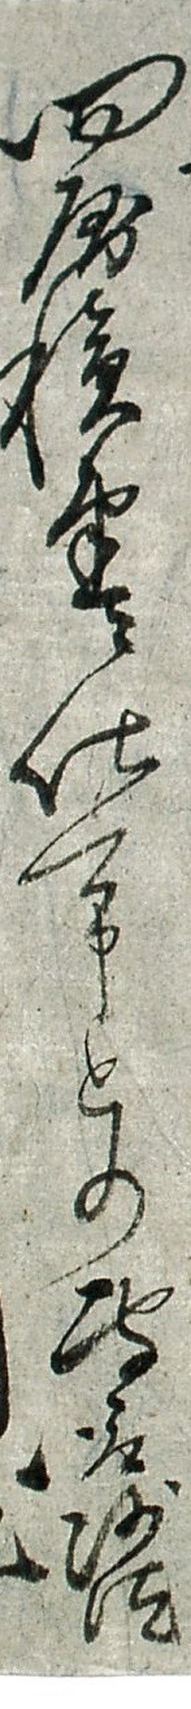問屋積金に仕可申との専取沙汰に
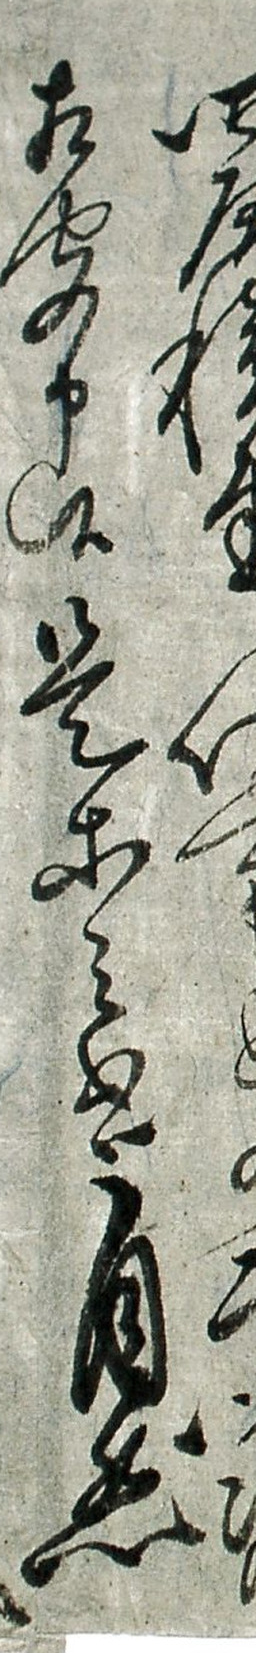相聞申候是等之義は自然
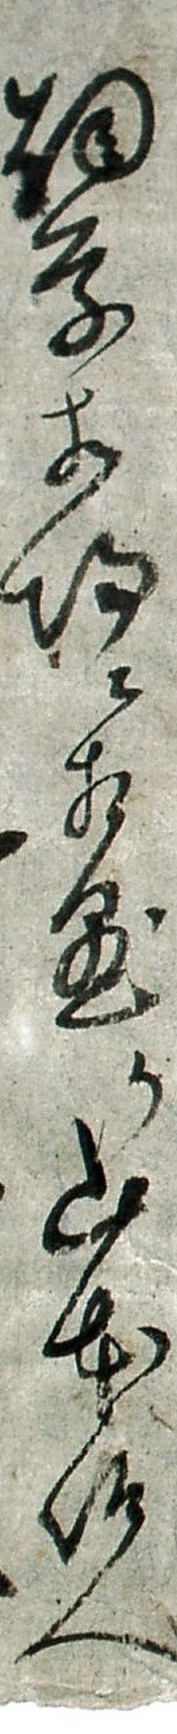烟草相場に相懸り山本作人
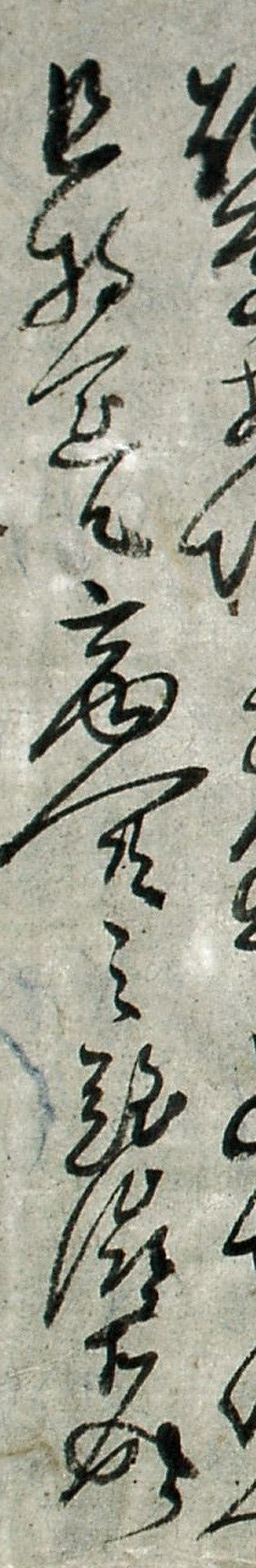且持運候商人共之難渋に相成り
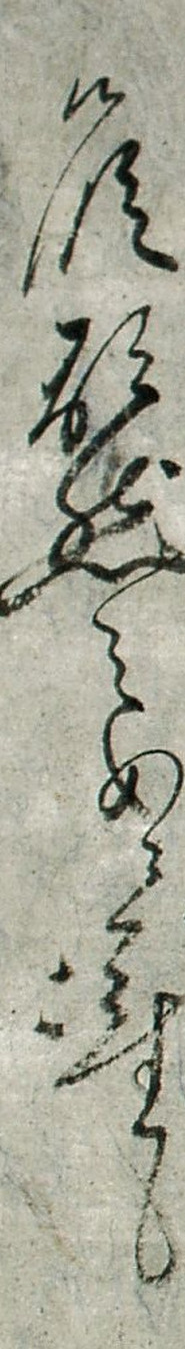候段顕然之義に御座候
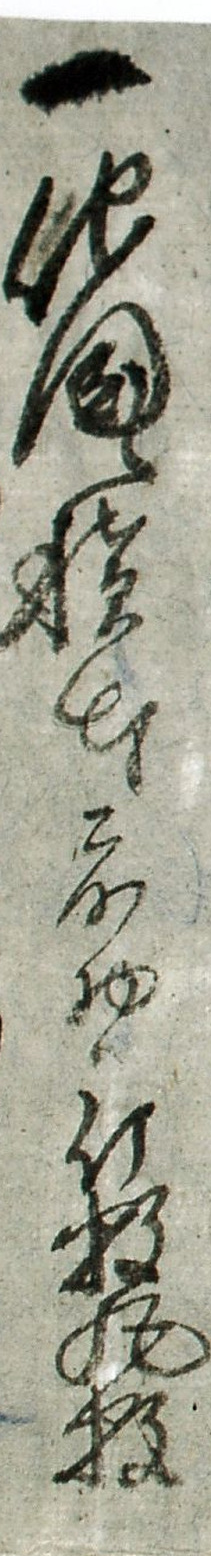一他国へ積出候荷物は斤数丸数
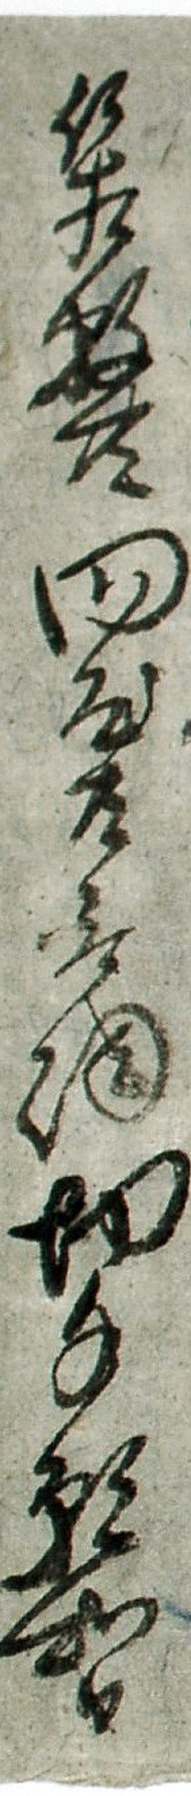箱数共問屋共取調切手願出候
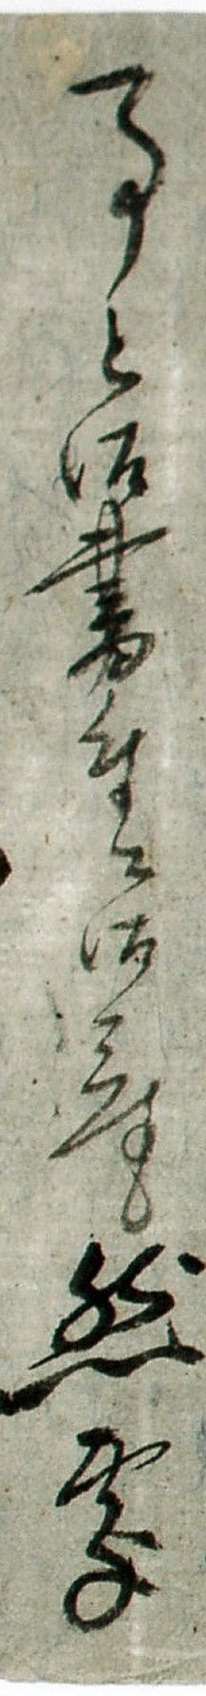事と御書付に御座候然処
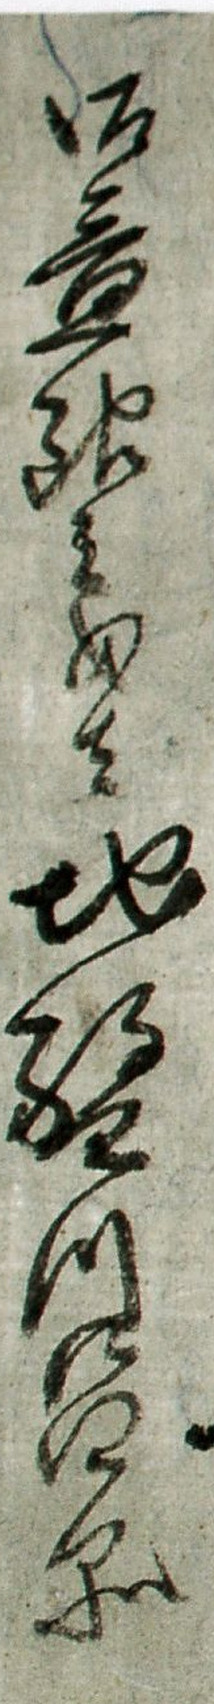御意銀之義は地盤川口四兵衛
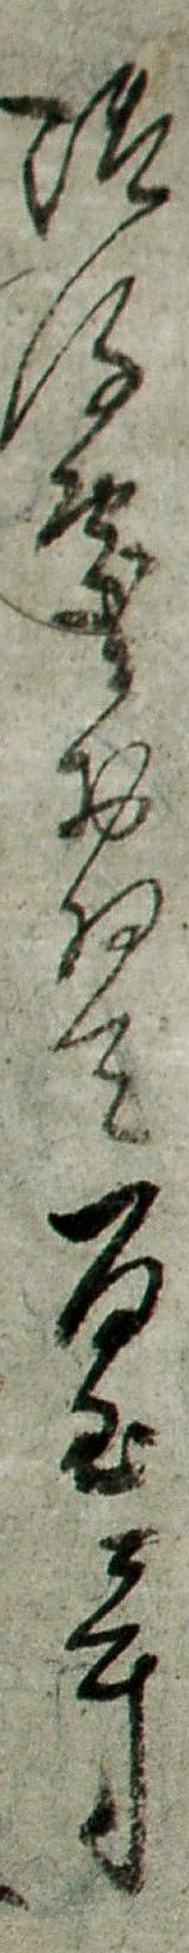御役所におゐて百玉に付
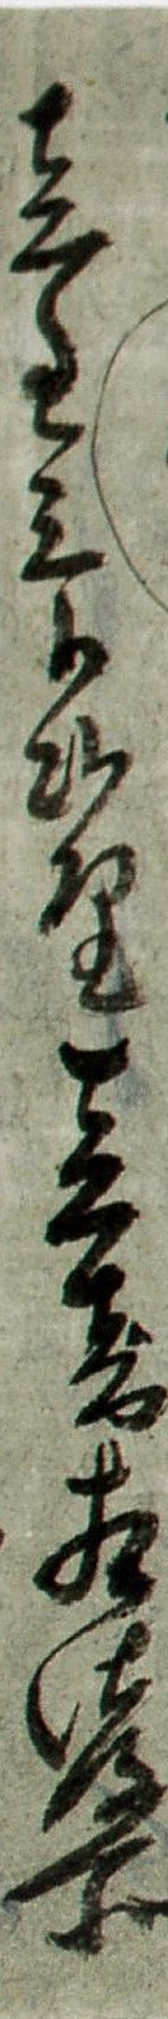壱匁三分弐厘壱歩相御役所
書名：(美馬三好両郡百姓共煙草問屋壱手勘定ニ相成迷惑願右始末承申上書付之写）
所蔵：鳴門教育大学 Naruto University of Education
